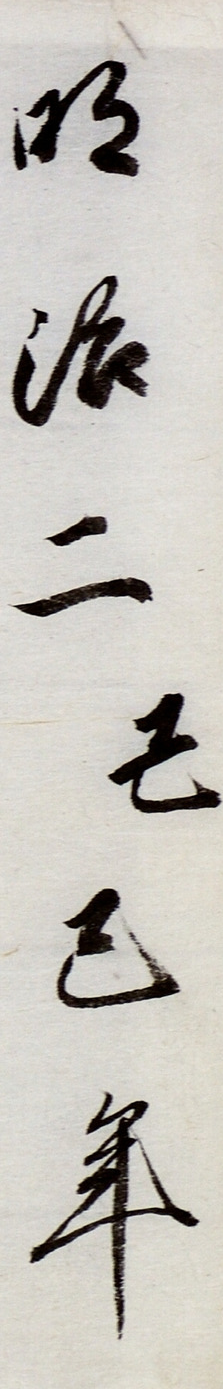明治二己巳年
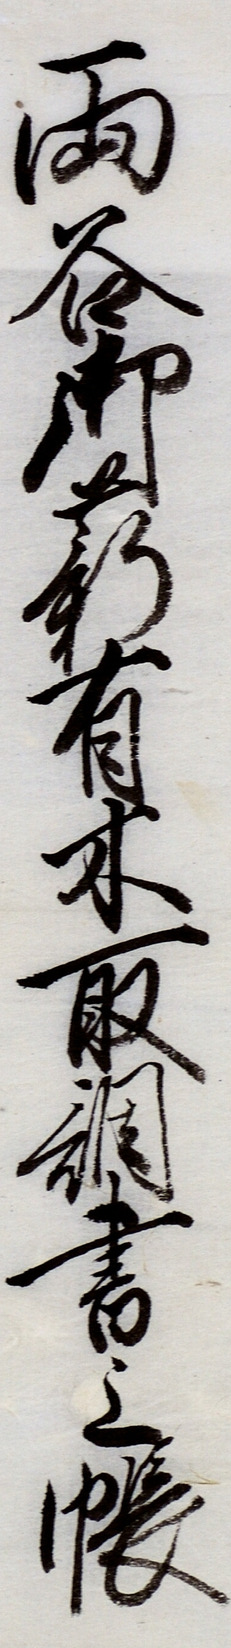両谷御薪有木取調書上帳
